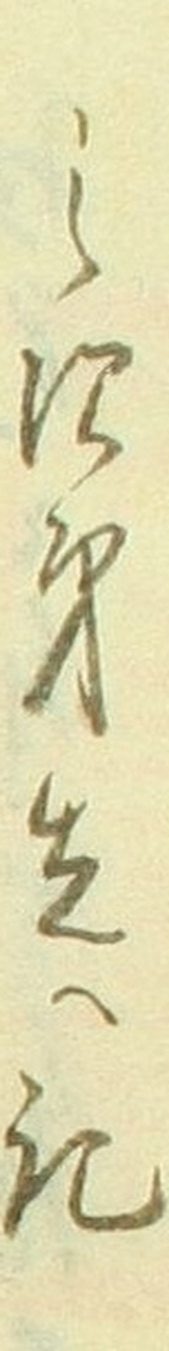之次第先へ記
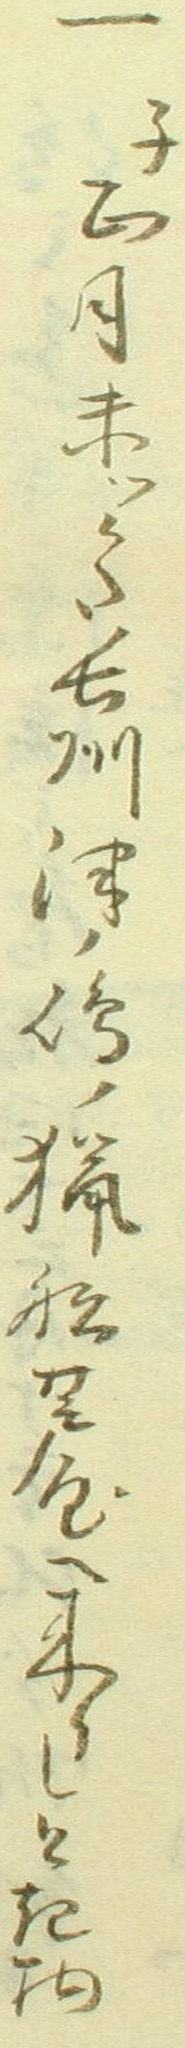一子正月未ツかた長州津ノ嶋ノ猟船芦屋へ来りしとき物
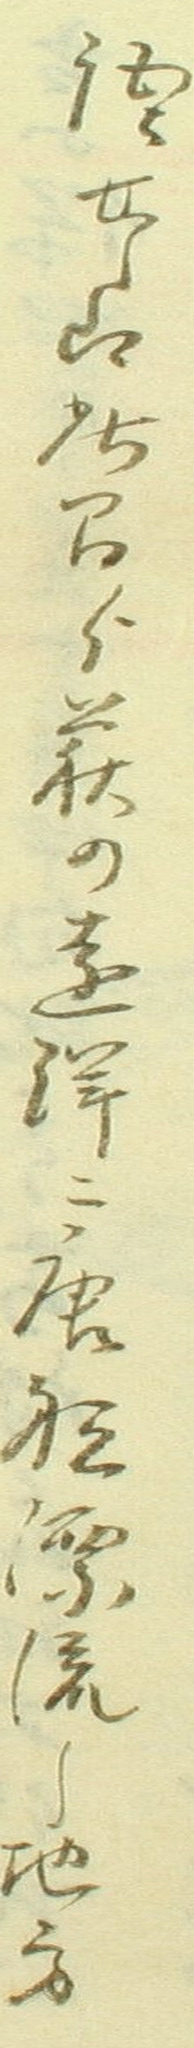語せし頃然間ゟ萩の遠洋に唐船漂流し地方
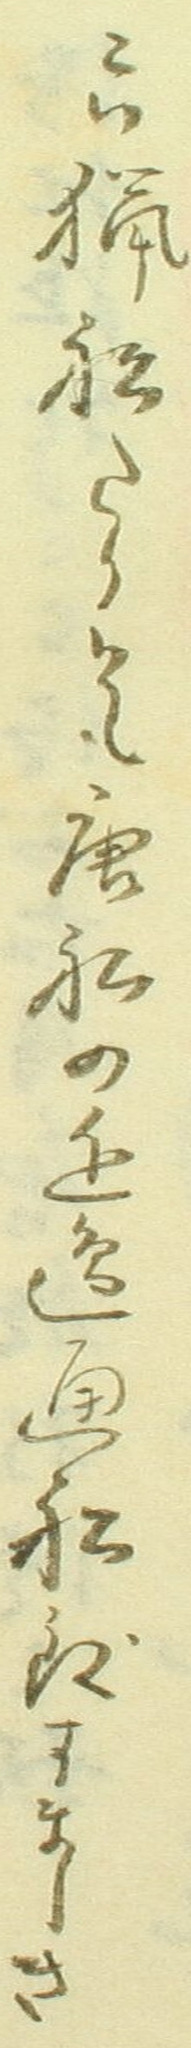こい猟船たりかも唐船の近辺通船致すましき
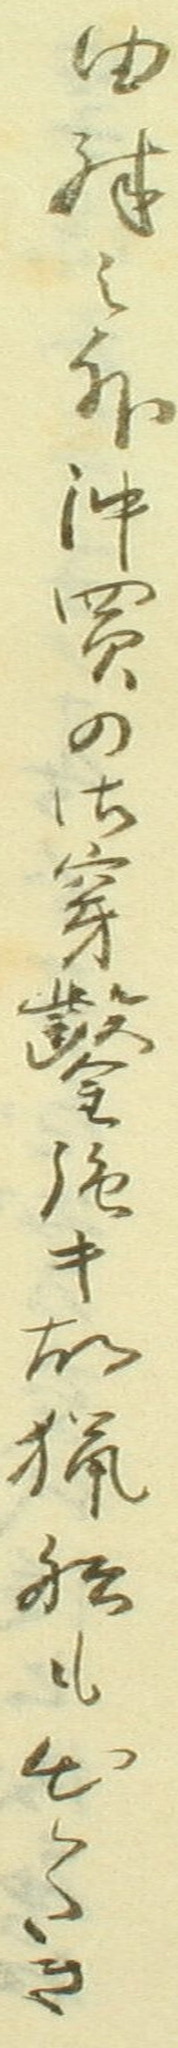由殊之外沖買の御穿鏧絶き故猟船も出かたき
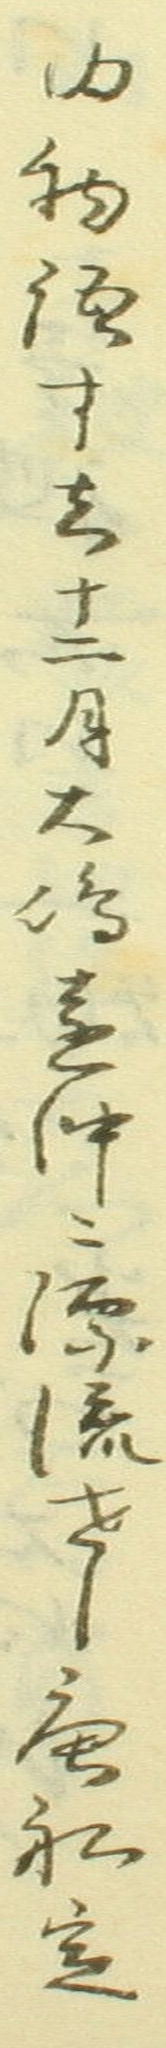内物語すさ去十二月大島遠沖に漂流せし唐船定
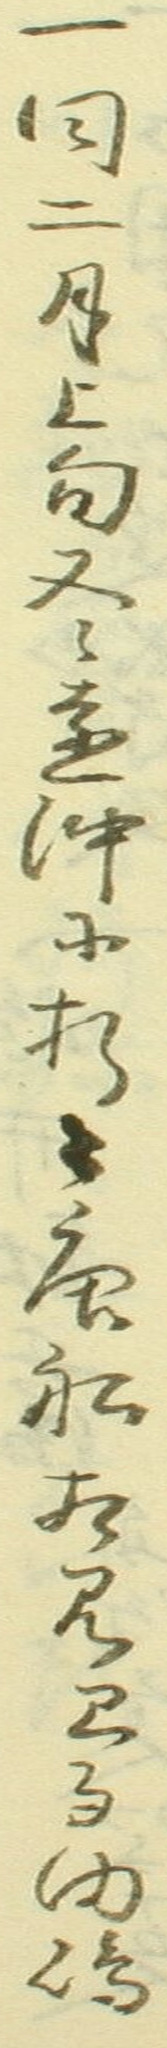一同二月上旬又又遠沖に折々唐船相見える内嶋
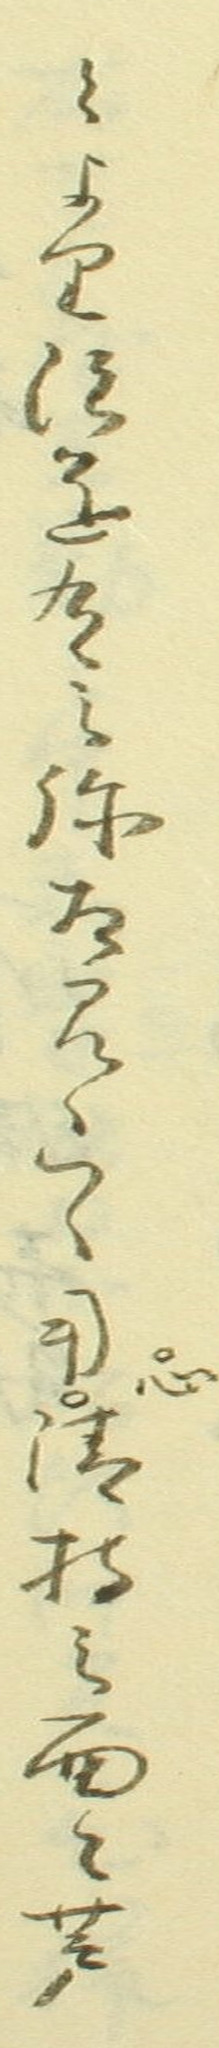しより注進有之弥相見候はは用心請持之面々芦
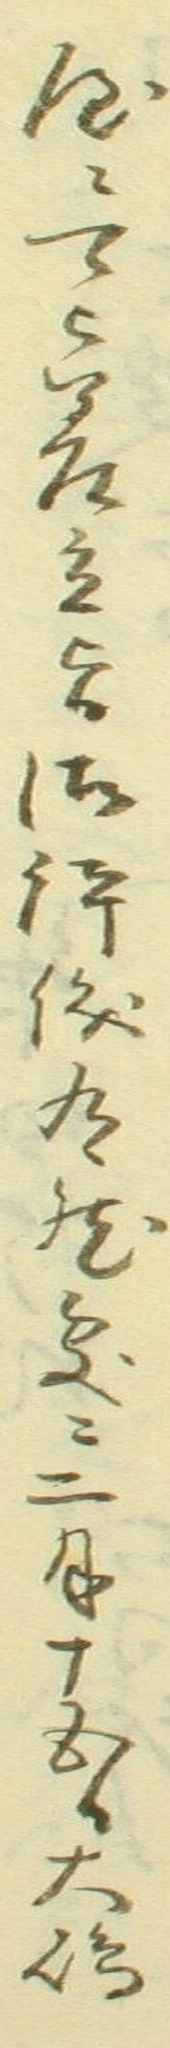屋にて被差立旨御倅儀有然處に二月十五日大嶋
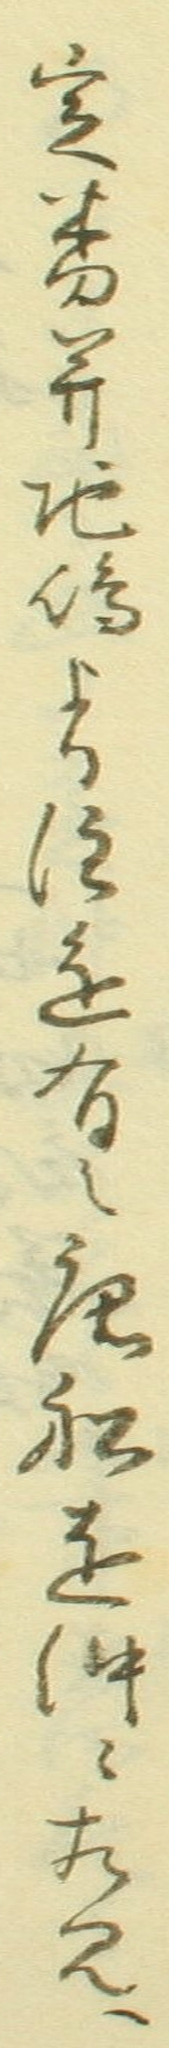定番並地嶋より注進有之唐船遠沖に相見へ
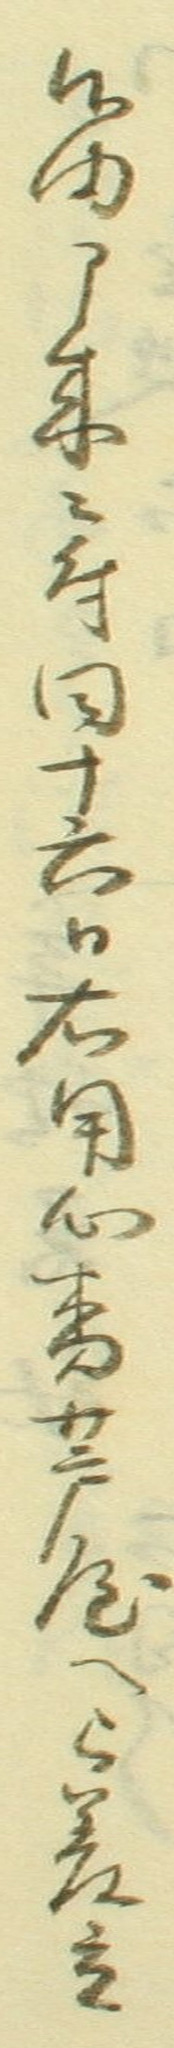候由申来に付同十六日右用心番芦屋へ被差立
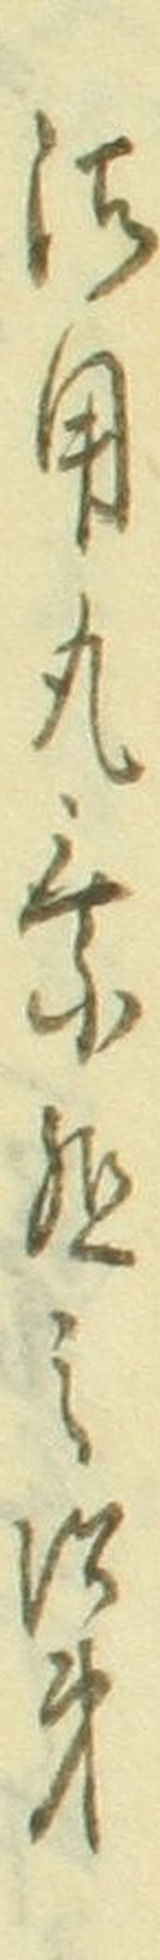御用丸乗組之次第
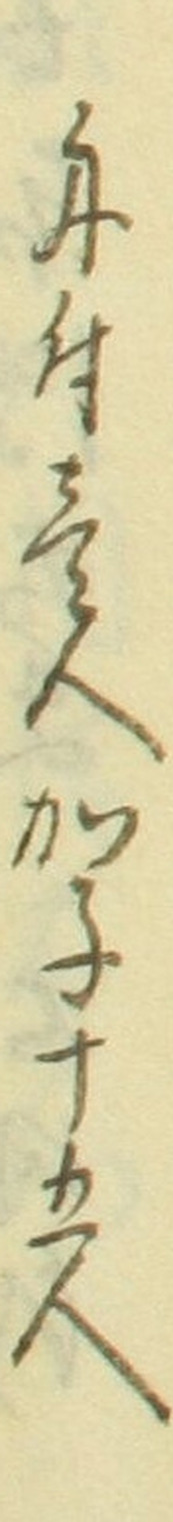舟付壱人加子十五人

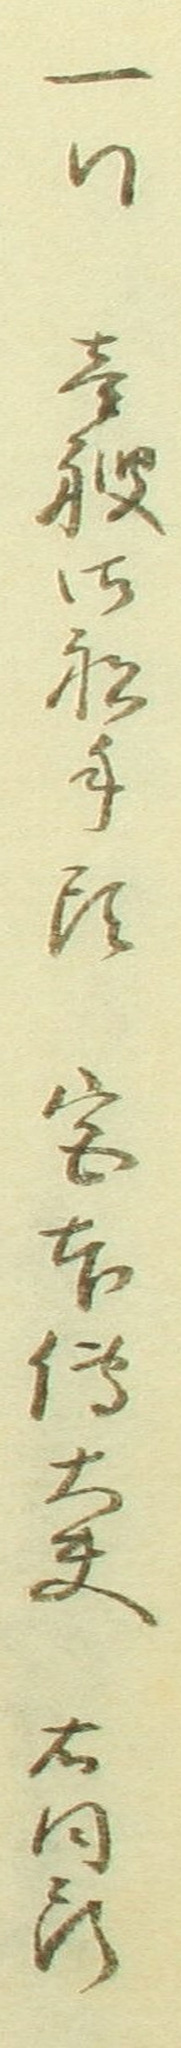一同壱艘御船手頭宮本伝太夫右同断
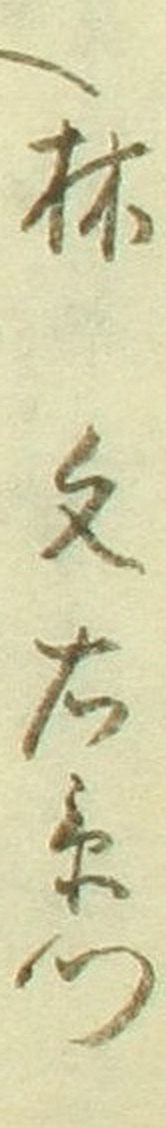畑小右衛門
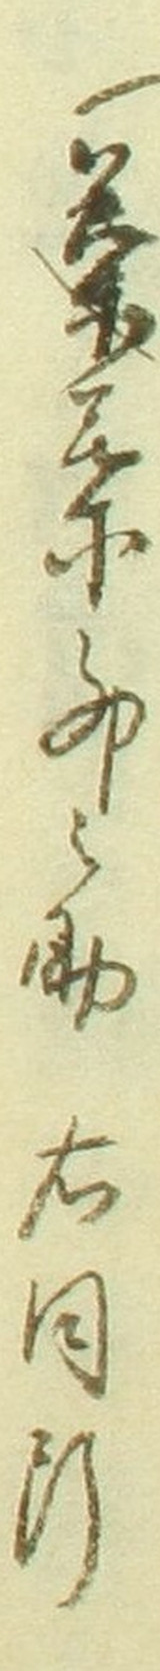？葉卯之介右同断
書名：唐船漂流記 四
